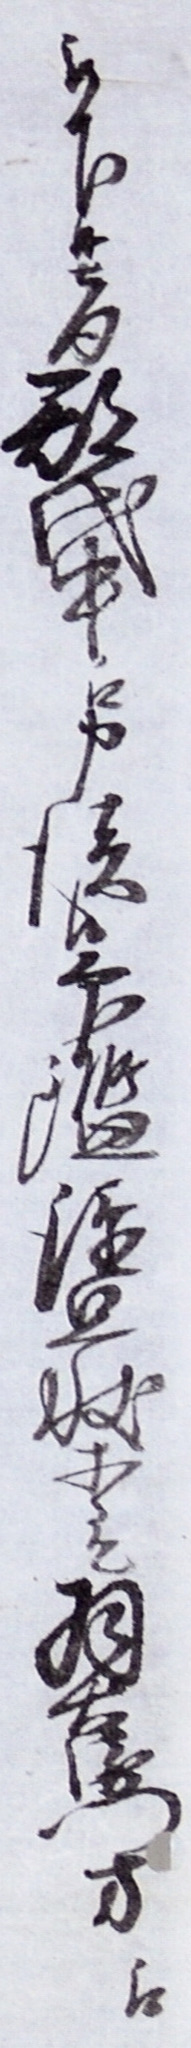被下候旨郡代中江申談候印鑑添廻状等にて羽左衛門方江
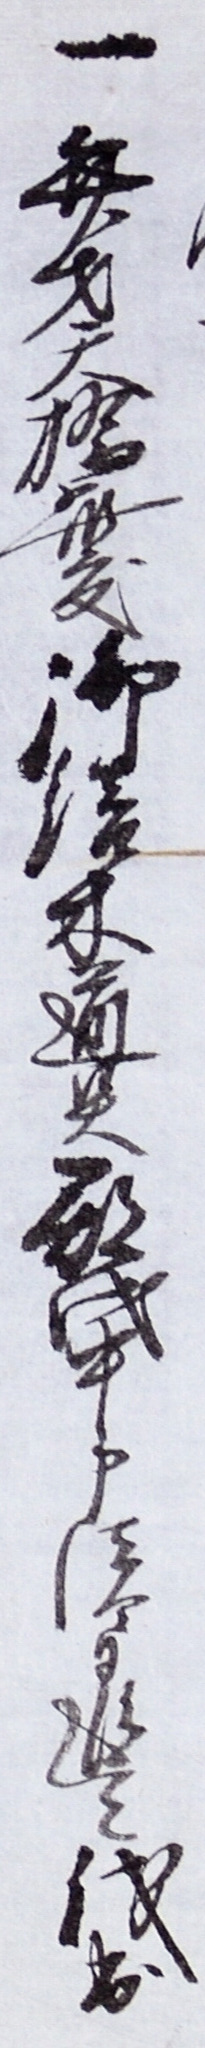一弁財天橋此度御請木道具郡代中申談ニ付々伐出
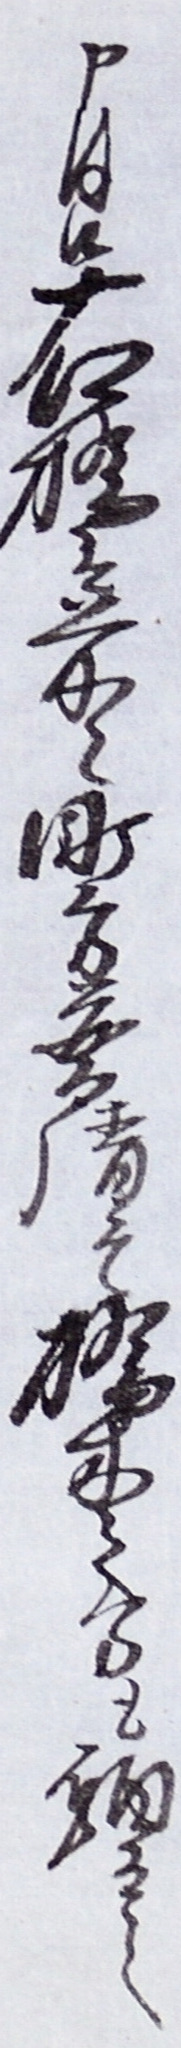申付候右橋は前々町方普請ニて橋木之方分も願有之
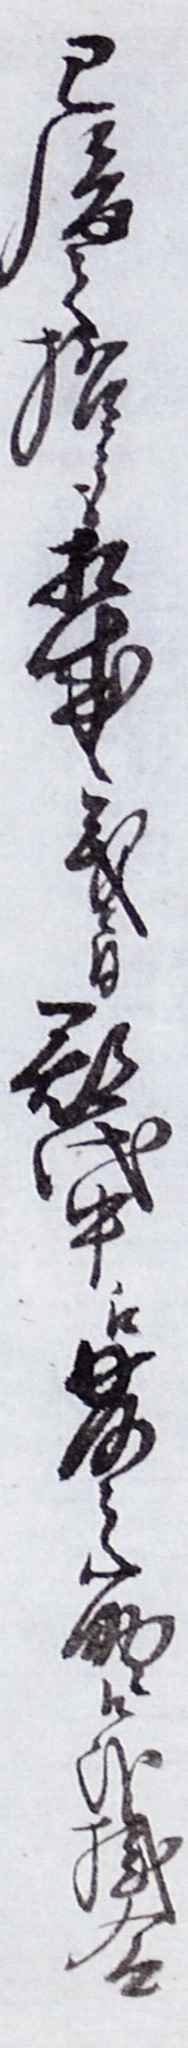已後之格ニも相成候義ニ付郡代中江如何之筋ニ候哉掛合
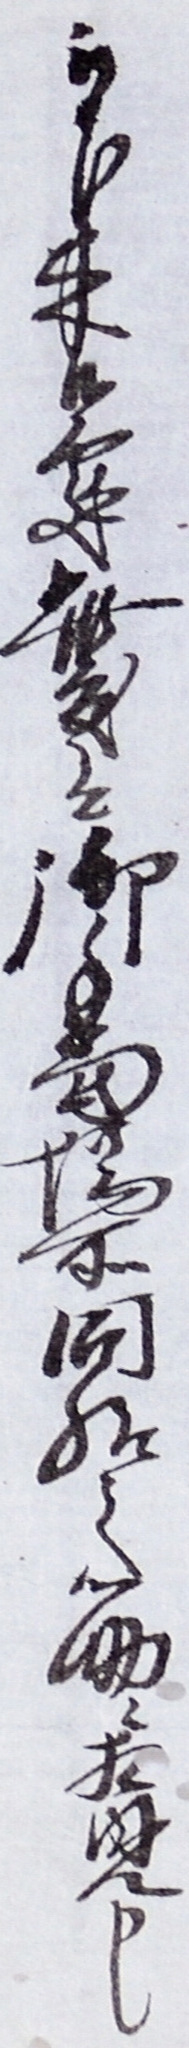被下来候処此度は御手当場所同様之筋ニ相見申候
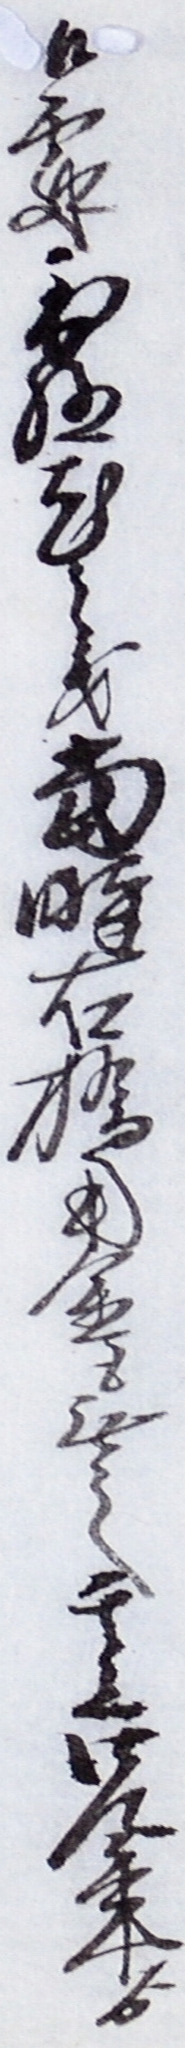候処至極尤之義当時右橋用金も無之其上先年ゟ
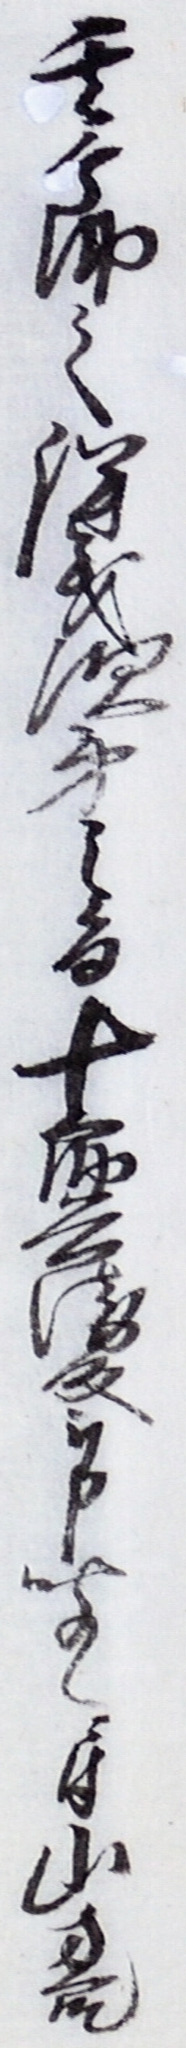其節之詳義次第之旨十郎兵衛殿被申聞候ニ付山方衆
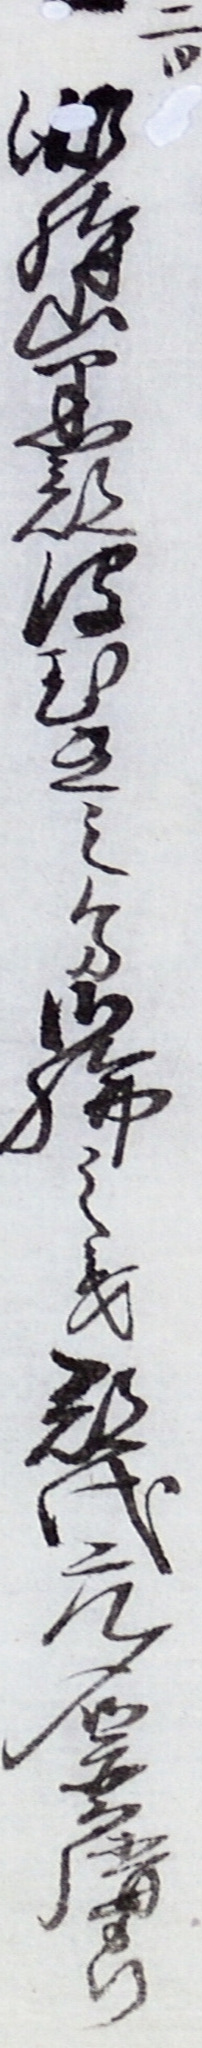一非持山黒部はむれ之分御払之義郡代元〆御普請奉行
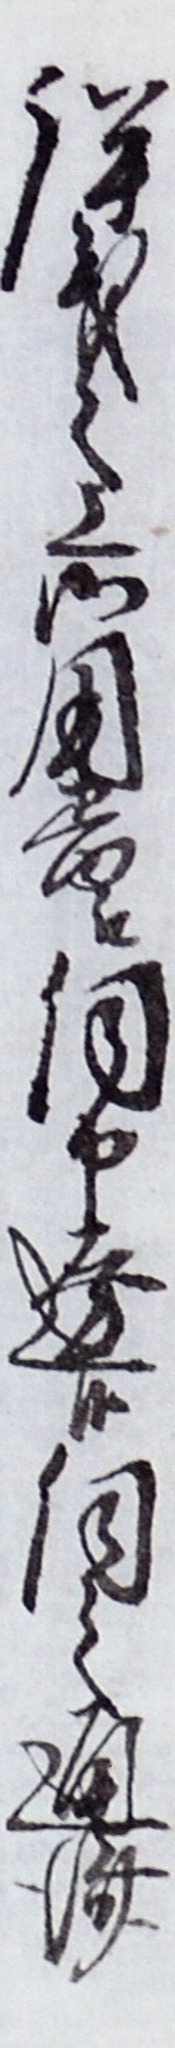詳義之上御用番江伺申達候伺之通済
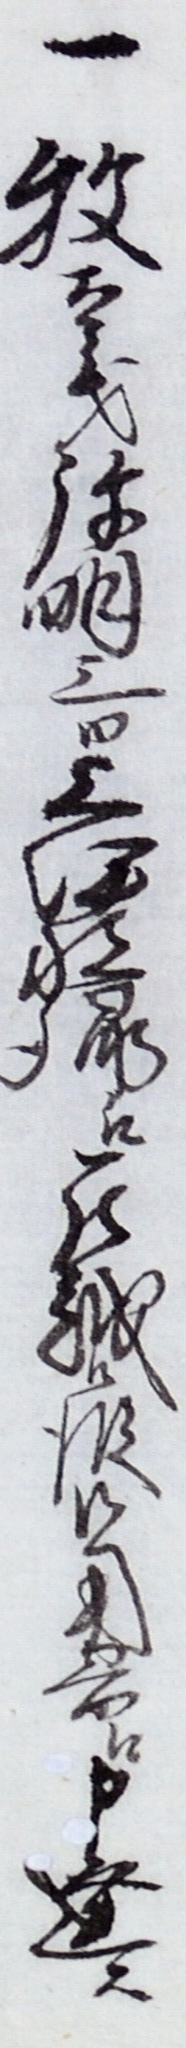一牧太義弥明三日上伊那郷江罷越候段御用番江申達ス
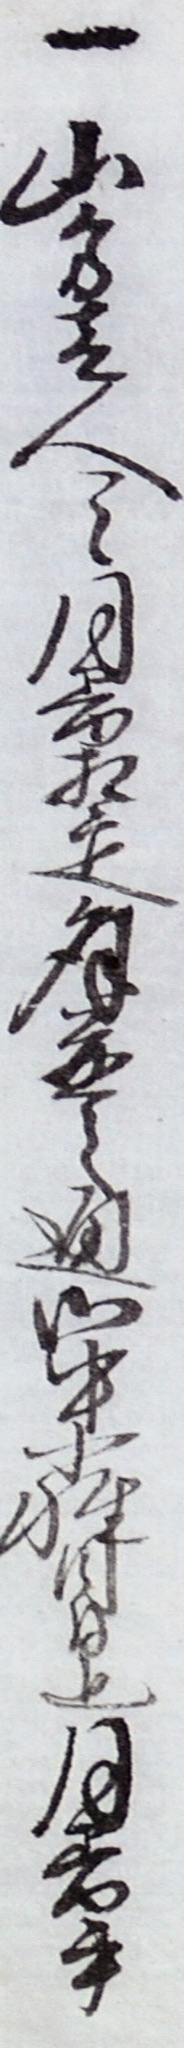一山方壱人之月番相定外月並之通御中小性目付迄月番書
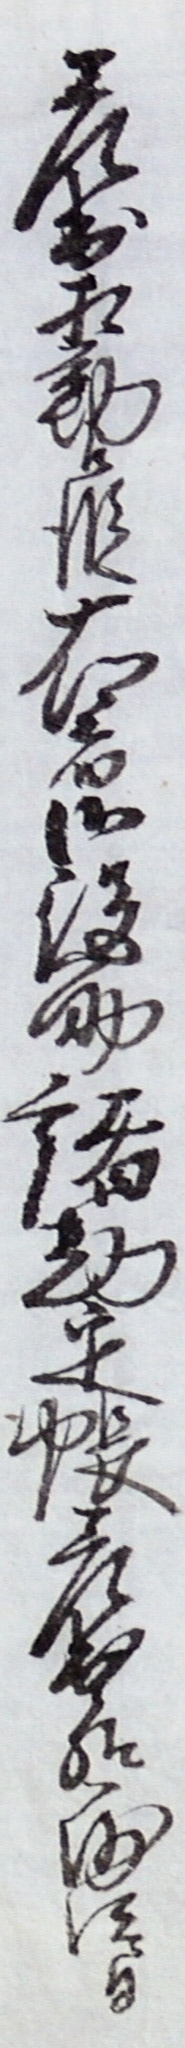差出相勤候段右は御役筋諸勘定帳差出候様御沙汰ニ付
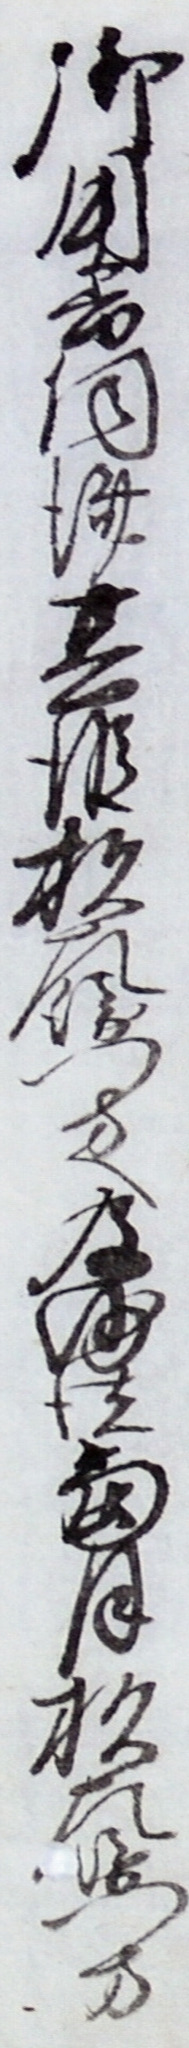御用番伺済其段杉衛門方へ及沙汰当月杉左衛門方
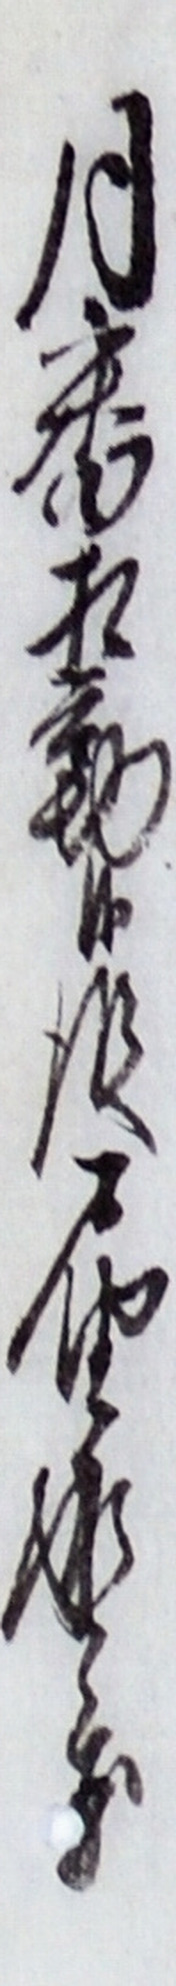月番相勤候段届承候置

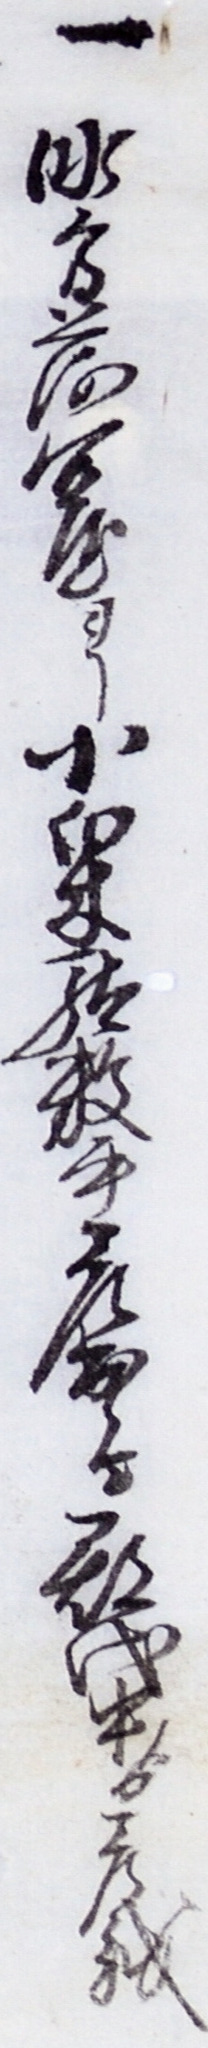一町方荷問屋ヨリ小白木駄数書差出候由郡代中より差越
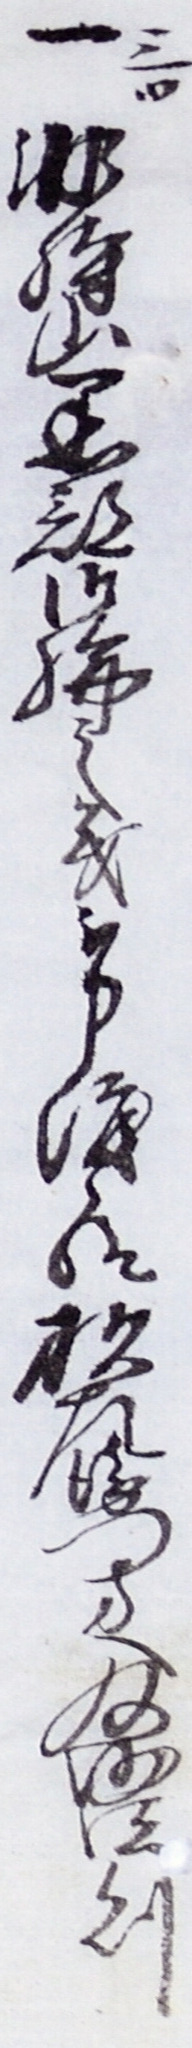一非持山黒部御払之義被申渡候様杉左衛門方へ及沙汰則
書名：御山奉行御用控
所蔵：伊那市立高遠町図書館・合同会社AMANE
